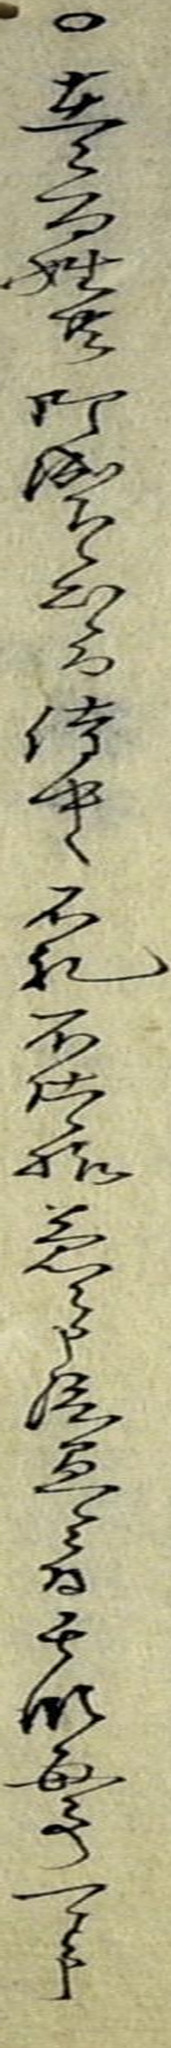〇在々百姓共御城下へ出候而侍中へ不礼不仕候様兼々申渡置候ニ付其段毎事可被申
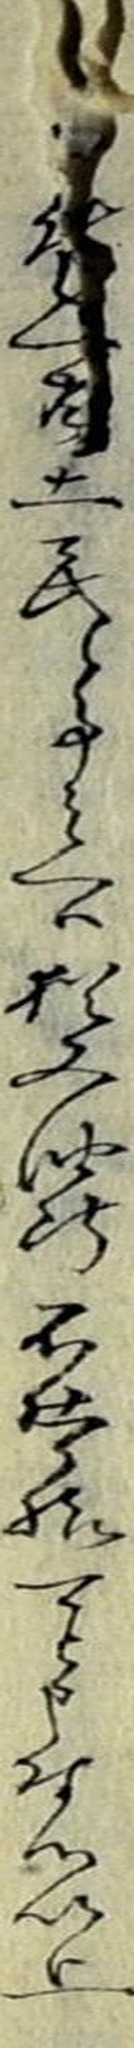付候へ共土民之事ニ候ヘハ猶又油断不仕候様可被申付候以上
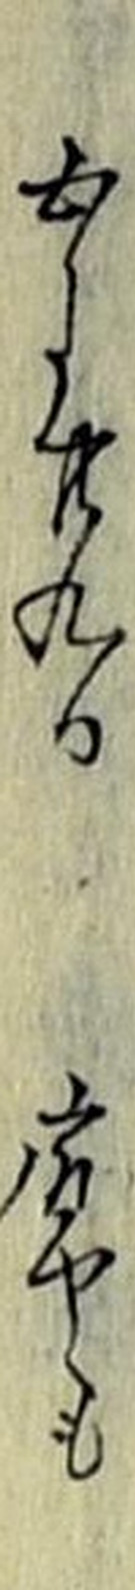五月廿九日府中へも
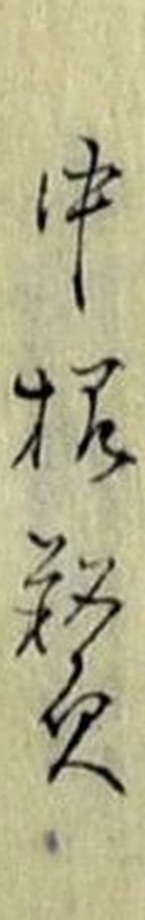中根靱負
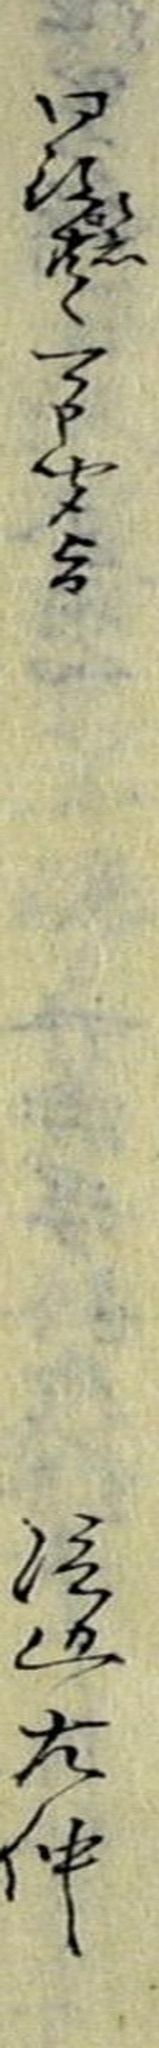同役之者共へ可申聞旨渡辺左仲
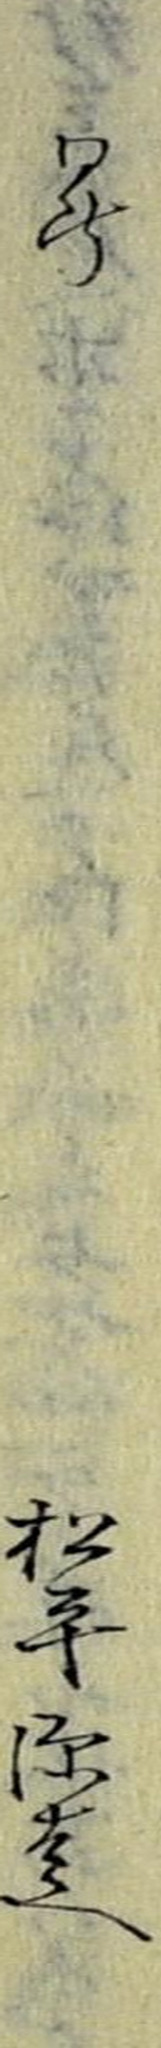同断松平源大夫
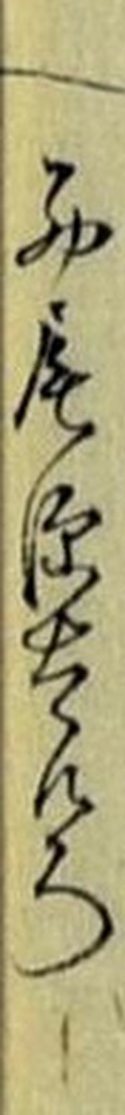西尾源太左衛門
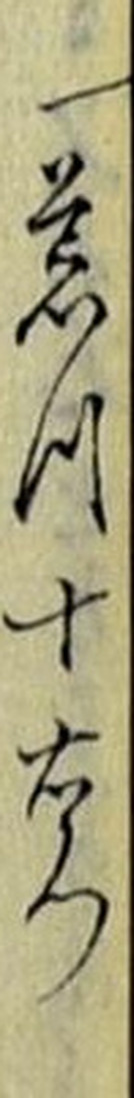荒川十右衛門
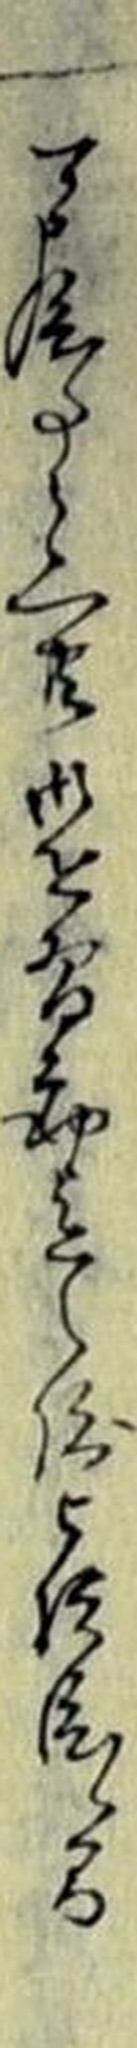可申渡事ニ候ヘ共御近習勤迄之儀被仰渡候間
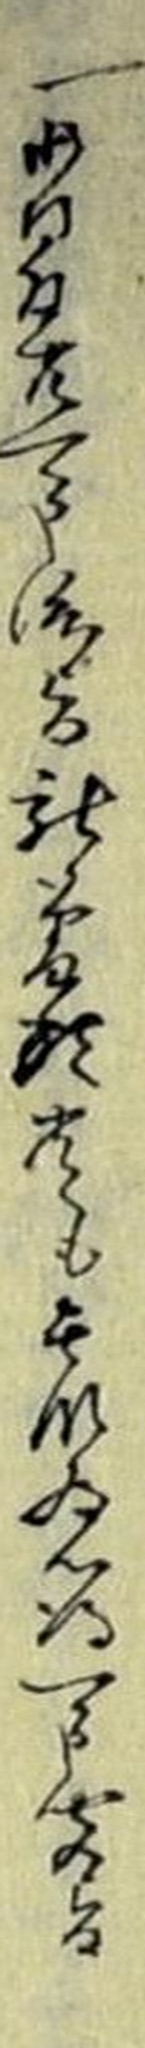御目付共可申渡旨新御番頭共へも其段為心得可申聞旨
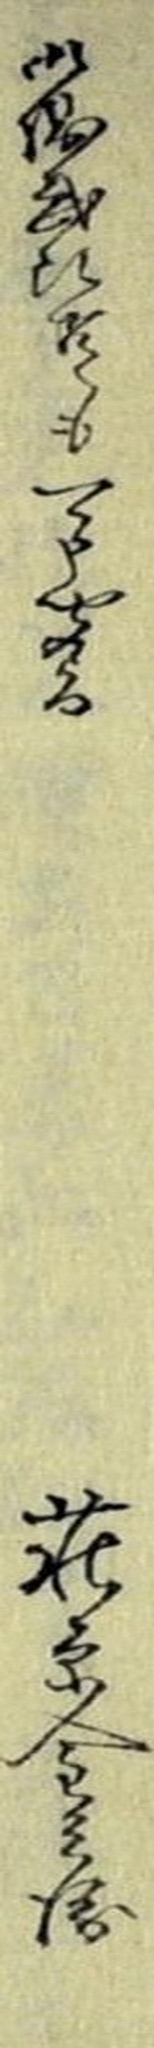御側武頭共へも可申聞旨萩原金兵衛
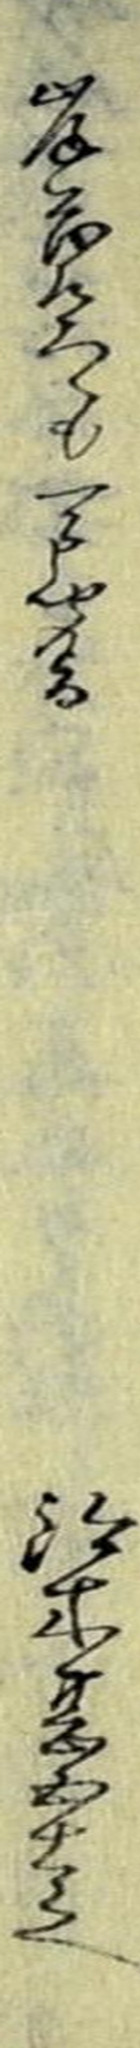岸茂左衛門へも可申聞旨鈴木甚五大夫
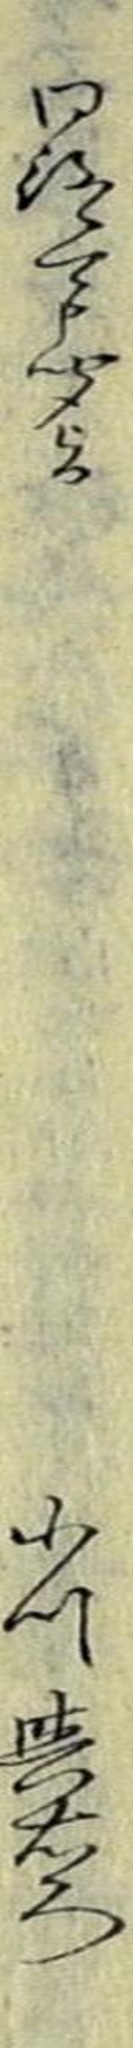同役へ可申聞旨小川与右衛門
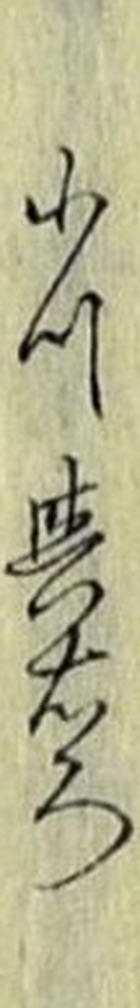荒川十右衛門
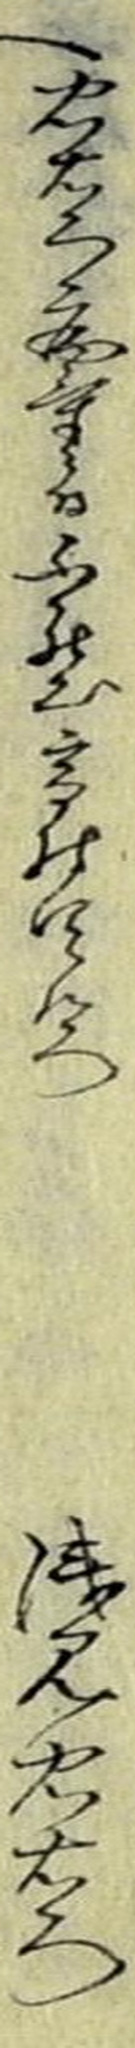忠右衛門病気ニ付不罷出高村四郎左衛門浅見忠右衛門
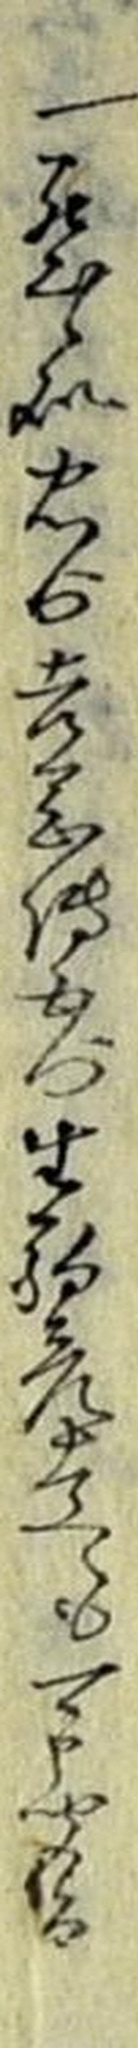罷出候処忠右衛門吉岡伝五右衛門生駒彦大夫へも可申聞旨
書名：命令之部 一
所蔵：福井県文書館 Fukui Prefectural Archives
